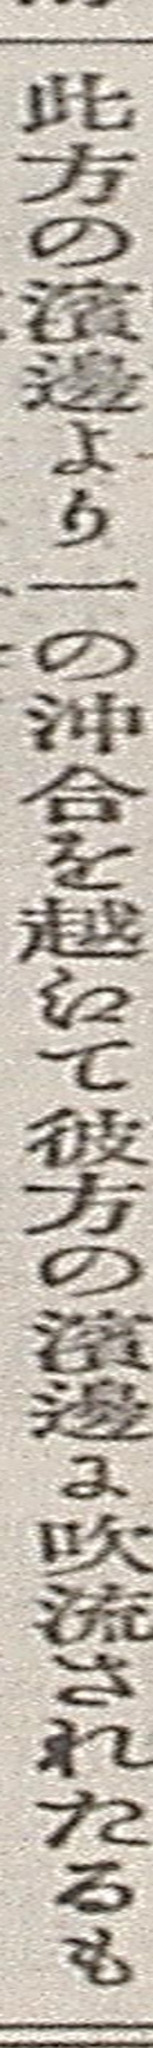此方の浜辺より一の沖合を越えて彼方の浜辺に吹流されたるも
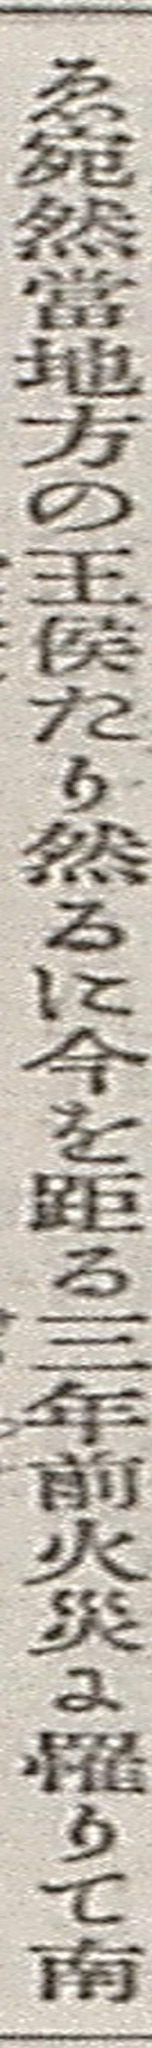ゑ宛然当地方の王侯たり然るに今を距る三年前火災に罹りて南
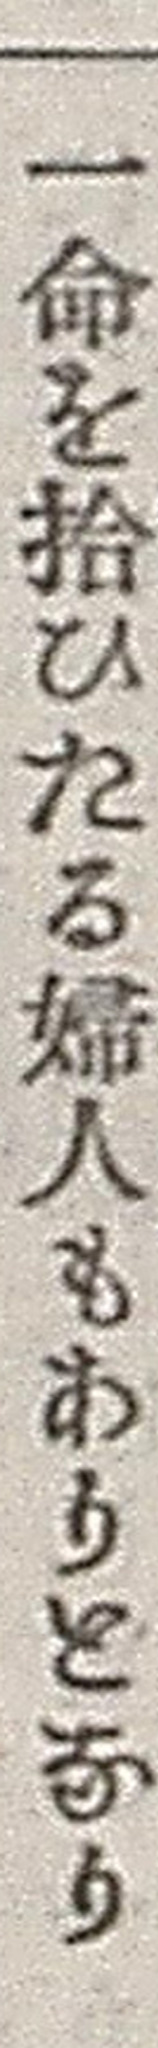一命を拾ひたる婦人もありとなり
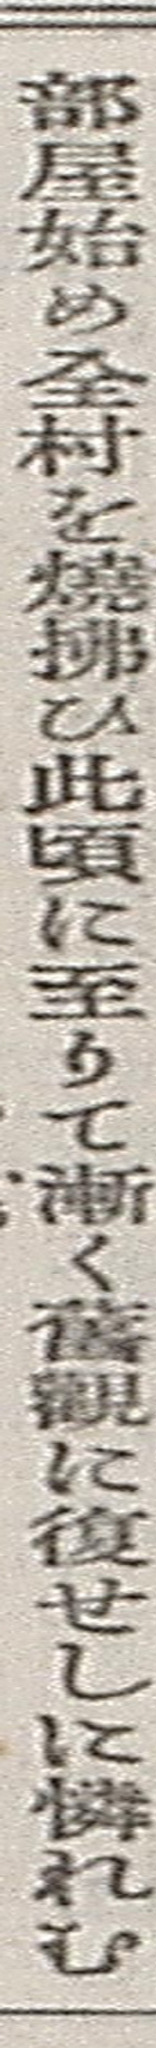部屋始め全村を焼払ひ此頃に至りて漸く旧観に復せしに憐れむ
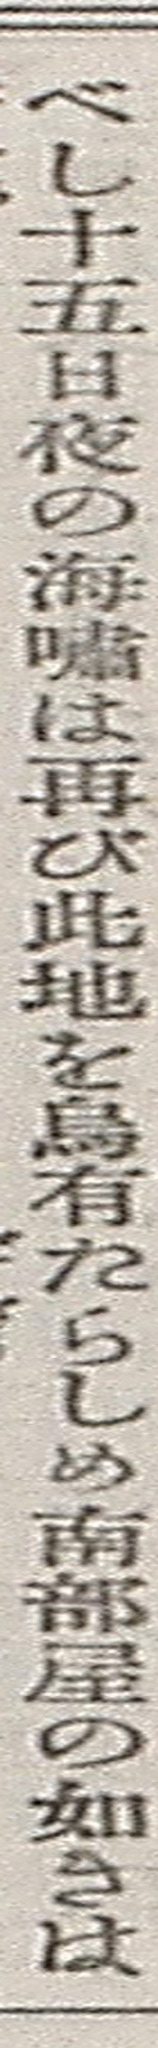べし十五日夜の海嘯は再び此地を烏有たらしめ南部屋の如きは
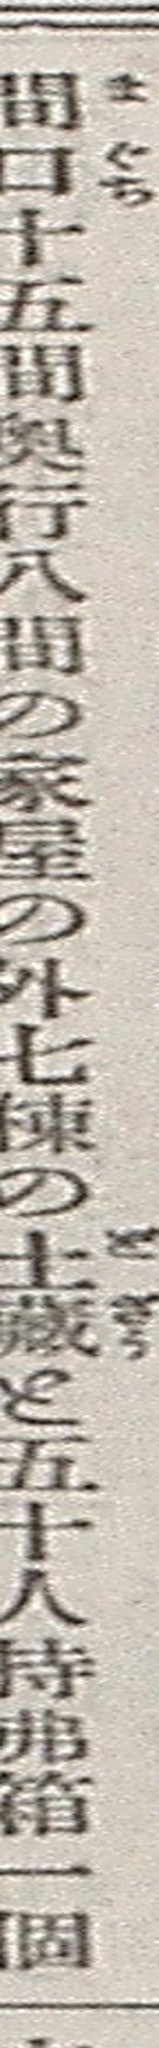間口十五間奥行八間の家屋の外七棟の土蔵と五十人持弗箱一個
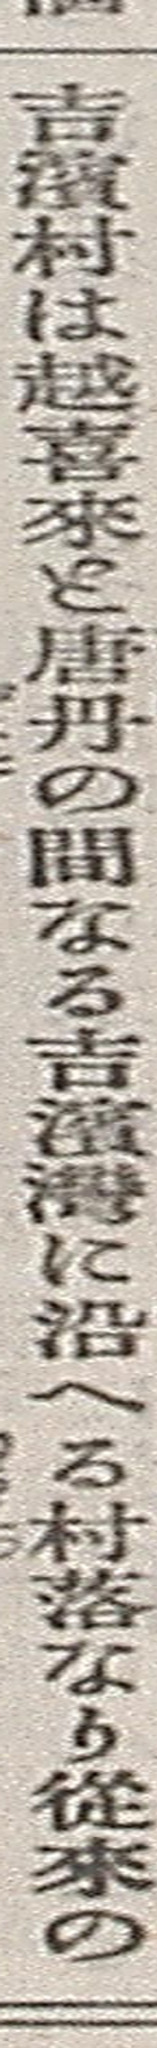吉浜村は越喜来と唐丹の間なる吉浜湾に沿へる村落なり従来の
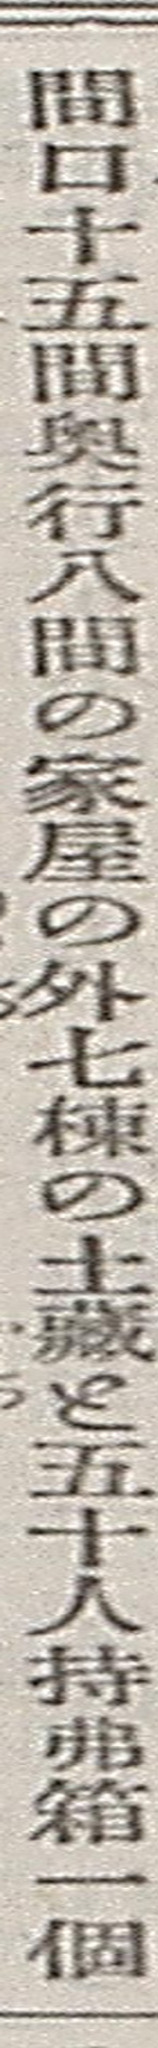間口十五間奥行八間の家屋の外七棟の土蔵と五十人持弗箱一個
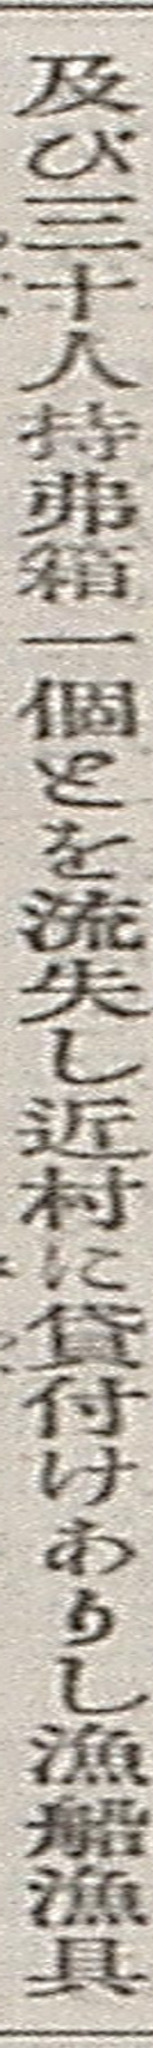及び三十人持弗箱一個とを流失し近村に貸付けありし漁船漁具
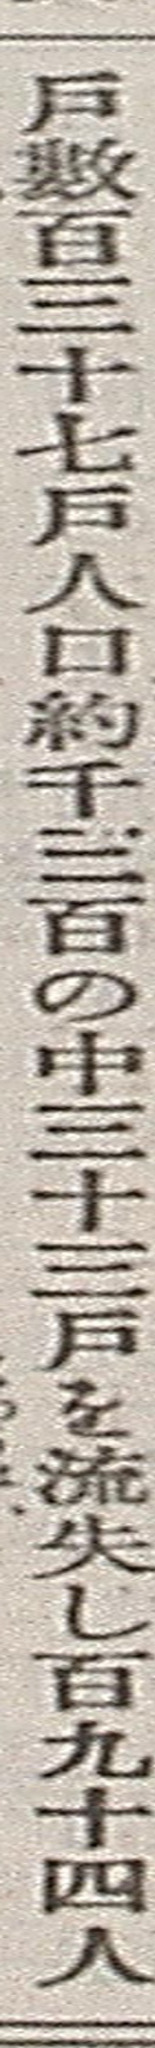戸数百三十七戸人口約千三百の中三十三戸を流失し百九十四人
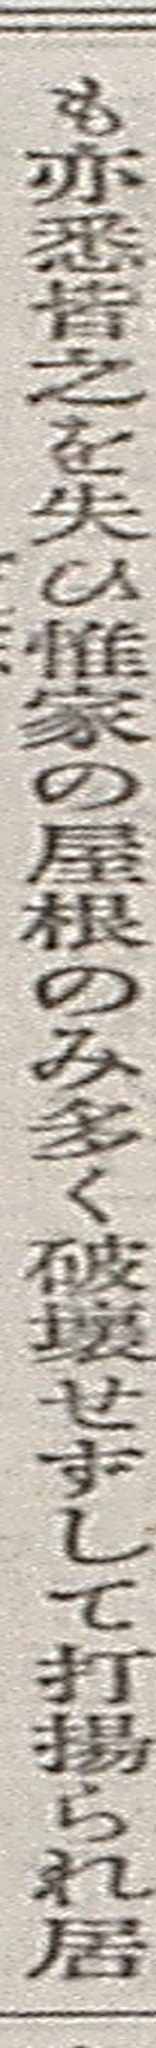も亦悉皆之を失ひ惟家の屋根のみ多く破壊せずして打揚られ居
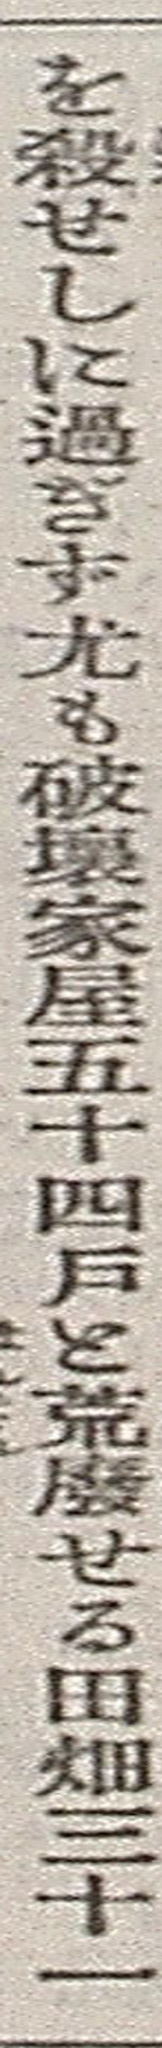を殺せしに過ぎず尤も破壊家屋五十四戸と荒廃せる田畑三十一
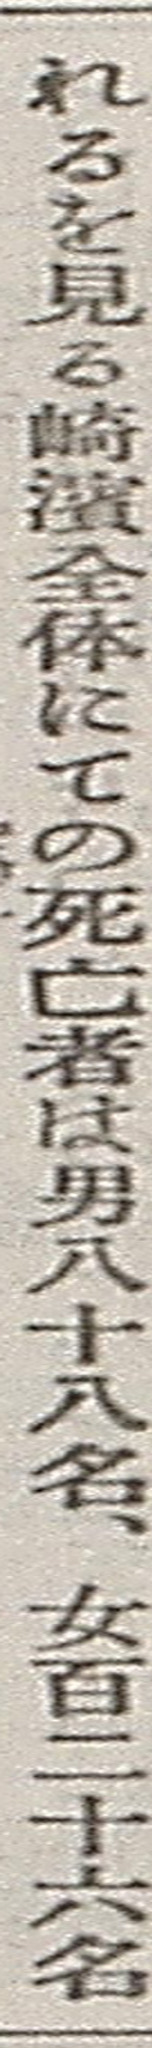れるを見る崎浜全体にての死亡者は男八十八名、女百二十六名
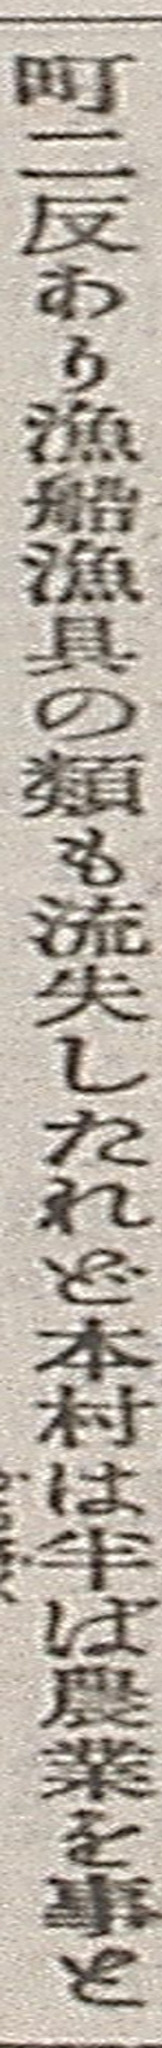町二反あり漁船漁具の類も流失したれど本村は半ば農業を事と
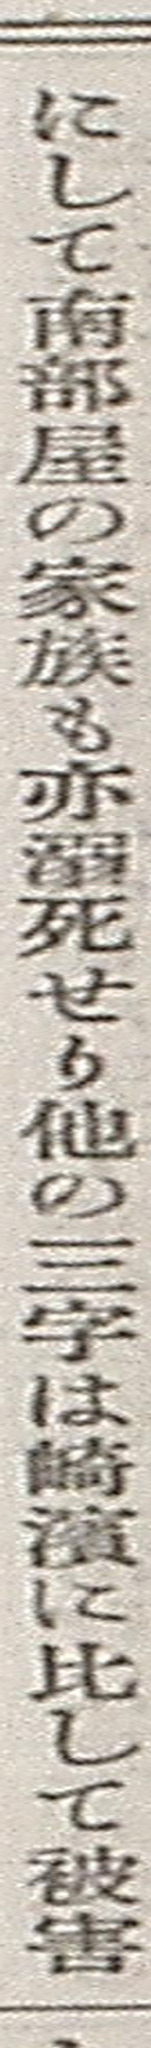にして南部屋の家族も亦溺死せり他の三字は崎浜に比して被害
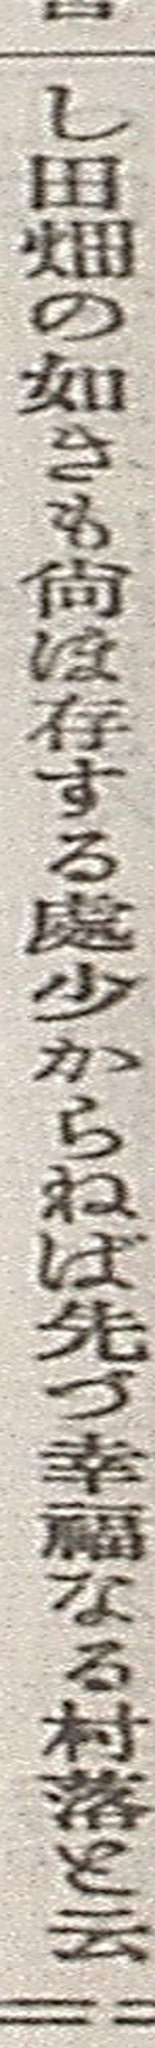し田畑の如きも尚ほ存する処少からねば先づ幸福なる村落と云
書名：風俗畫報臨時増刊第百十九號　大海嘯被害録（中）
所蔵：東京大学地震研究所図書室 Earthquake Research Institute Library, The University of Tokyo, JAPAN
